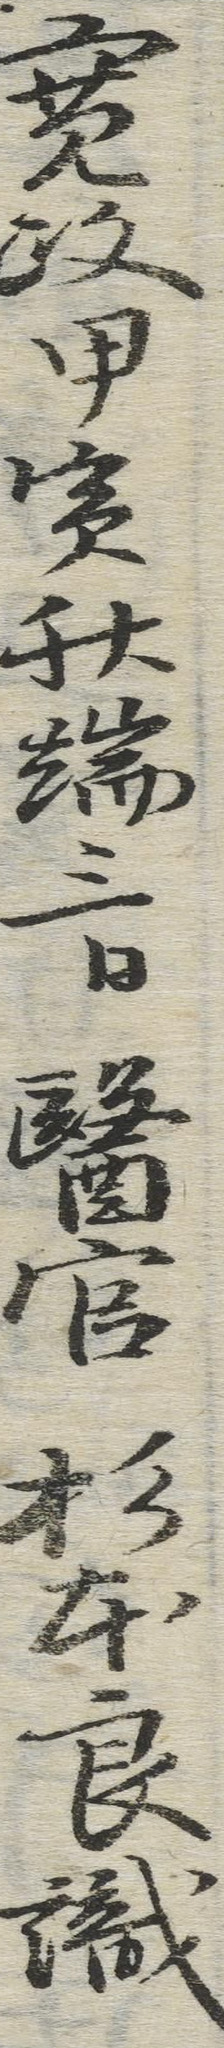寛政甲寅秋端三日医官杉本良識
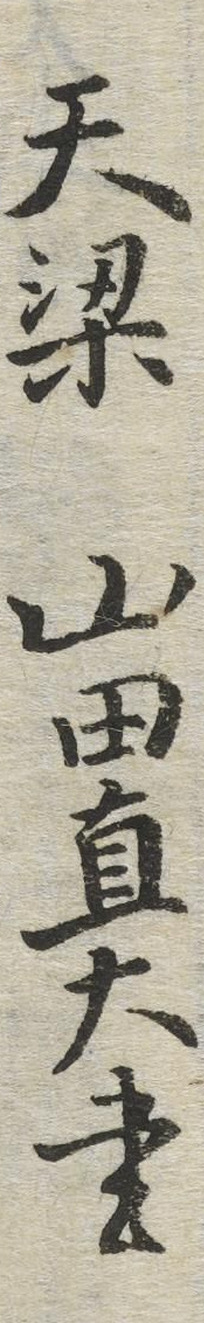天梁山田直大書
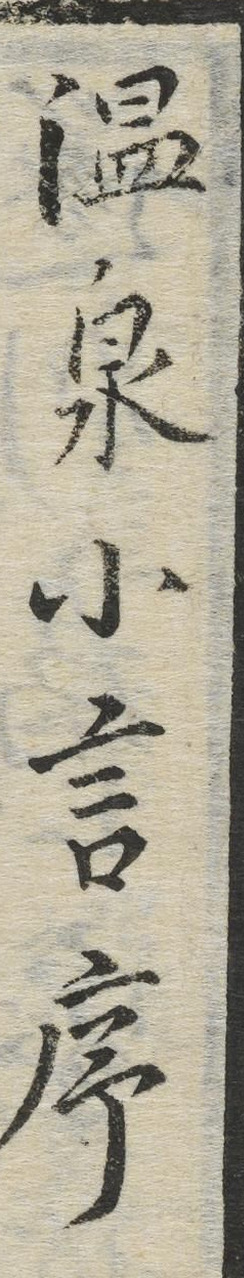温泉小言序
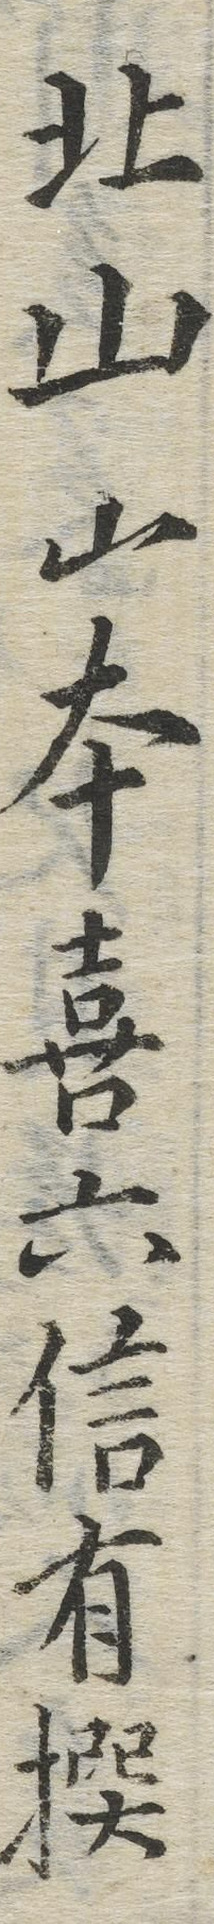北山山本喜六信有撰

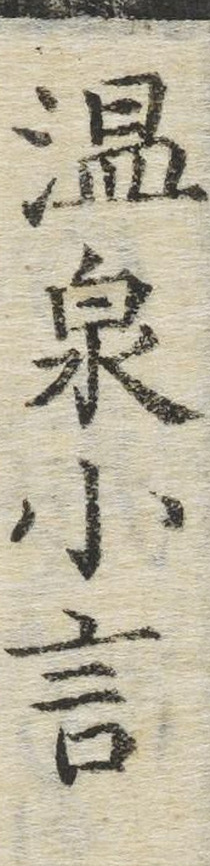温泉小言
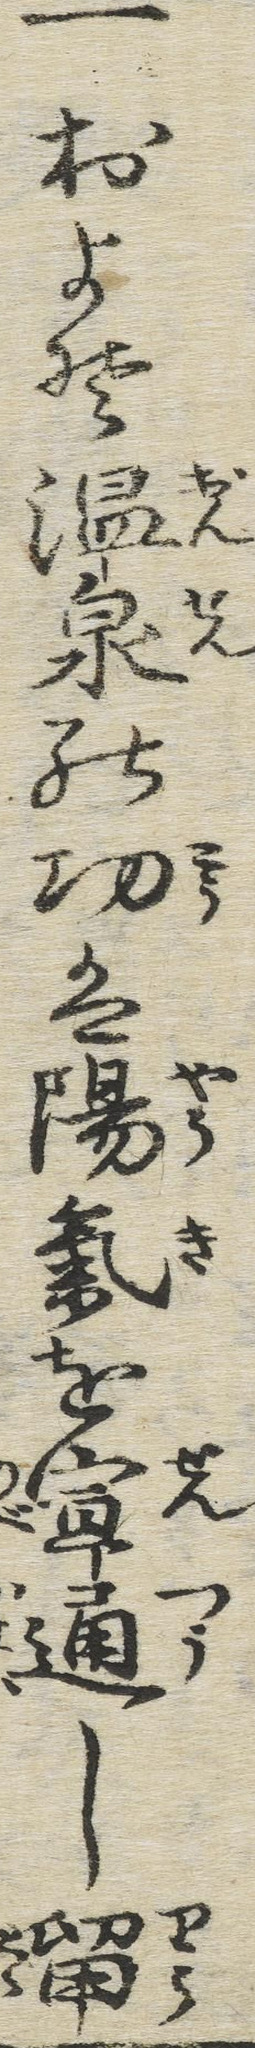一およそ温泉の功は陽気を宣通し溜
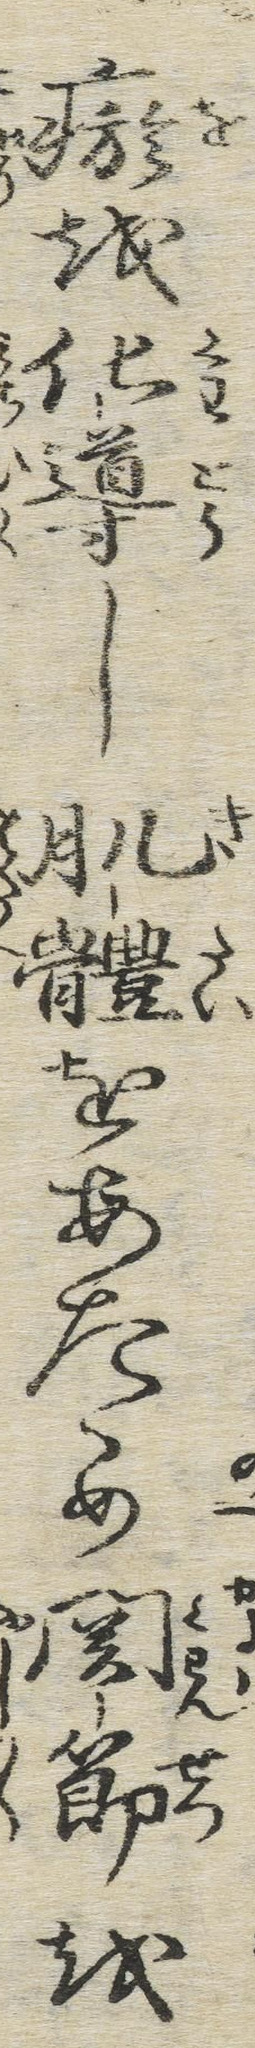瘀を化導し肌体をあたゝめ関節を
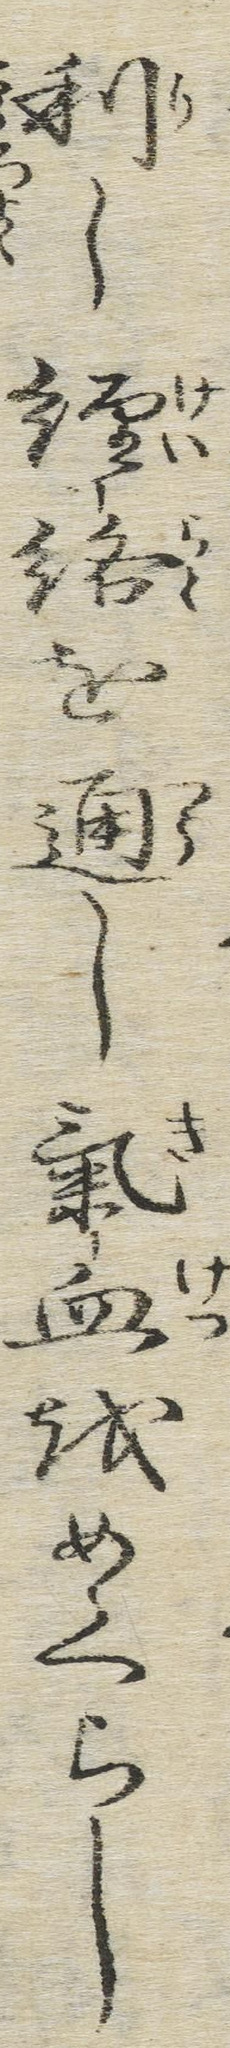利し経絡を通し気血をめくらし
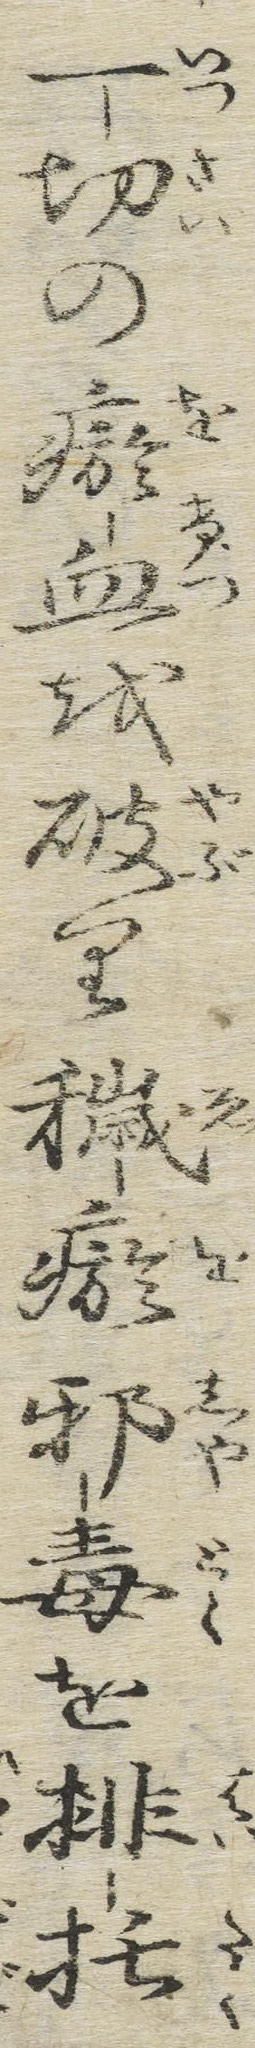一切の瘀血を破り穢瘀邪毒を排括
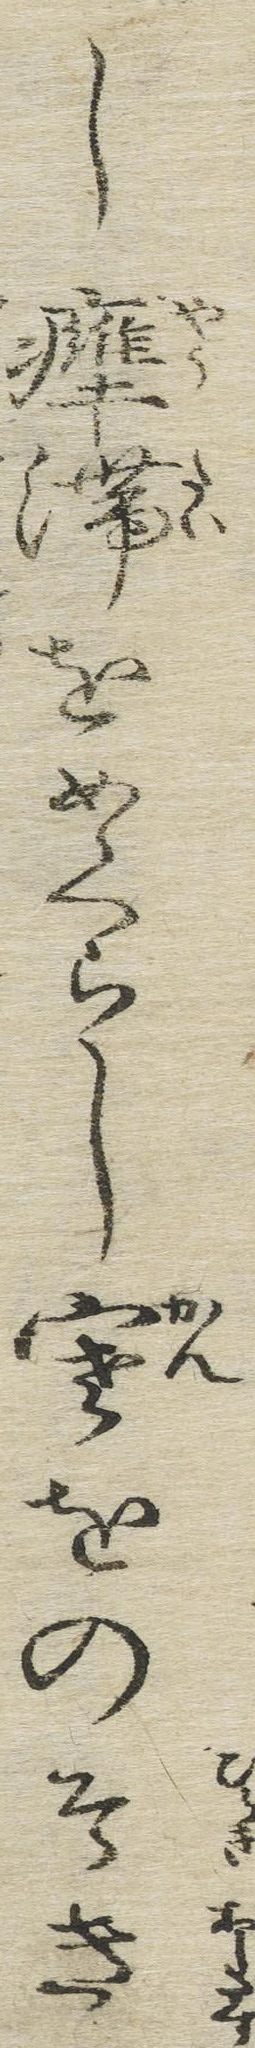し癕滞をめくらし寒をのそき
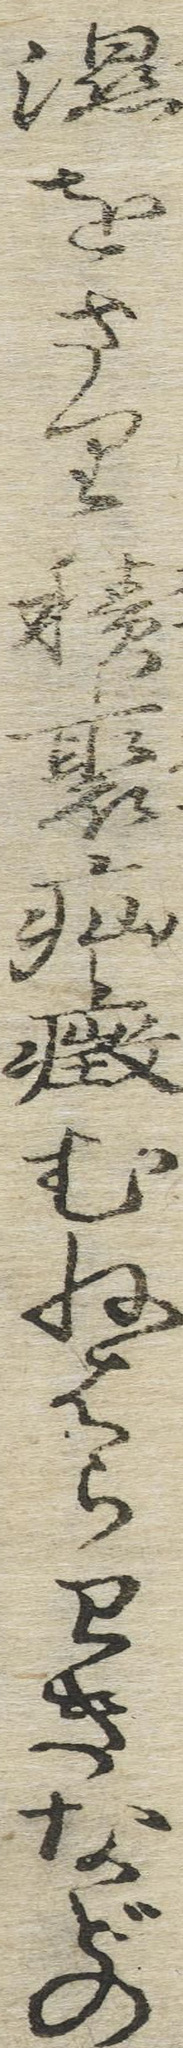湿をさり積聚疝癥むねはらわきなどの

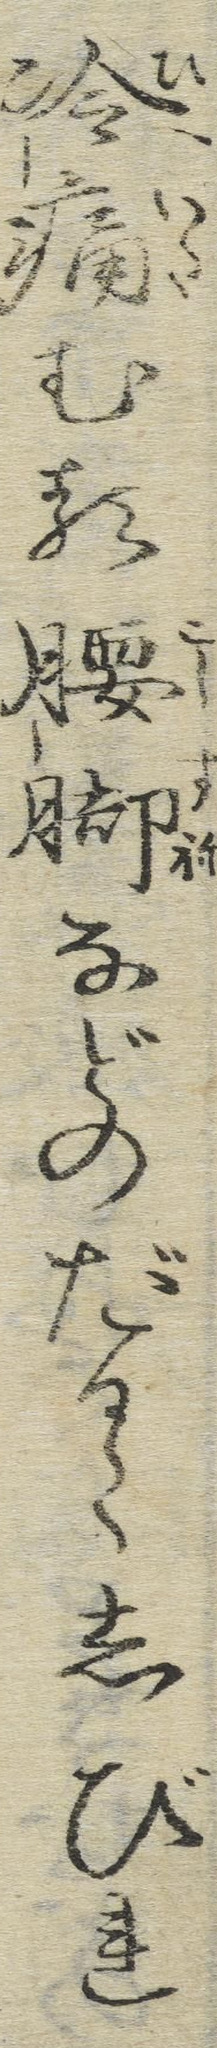冷痛むる腰脚などのだるくしびれ
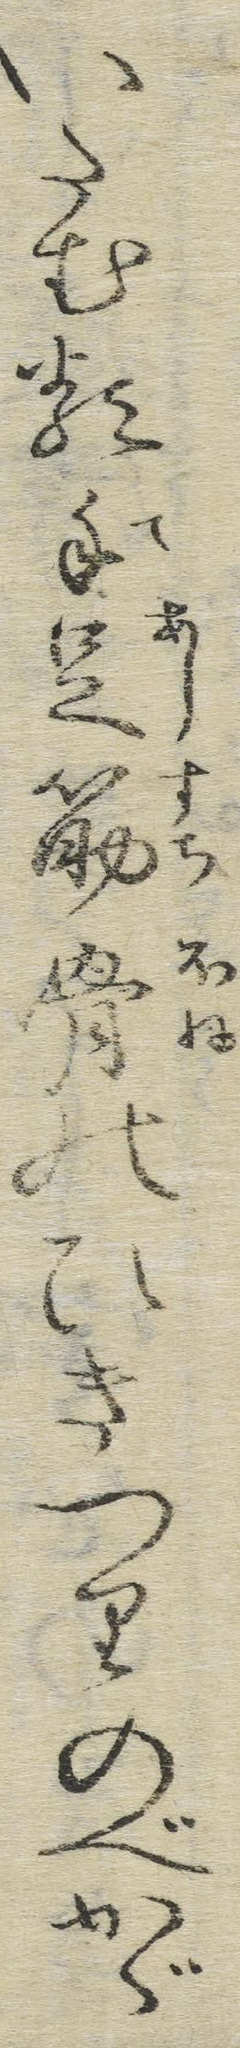いたむる手足筋骨のひきつりのべかゞ
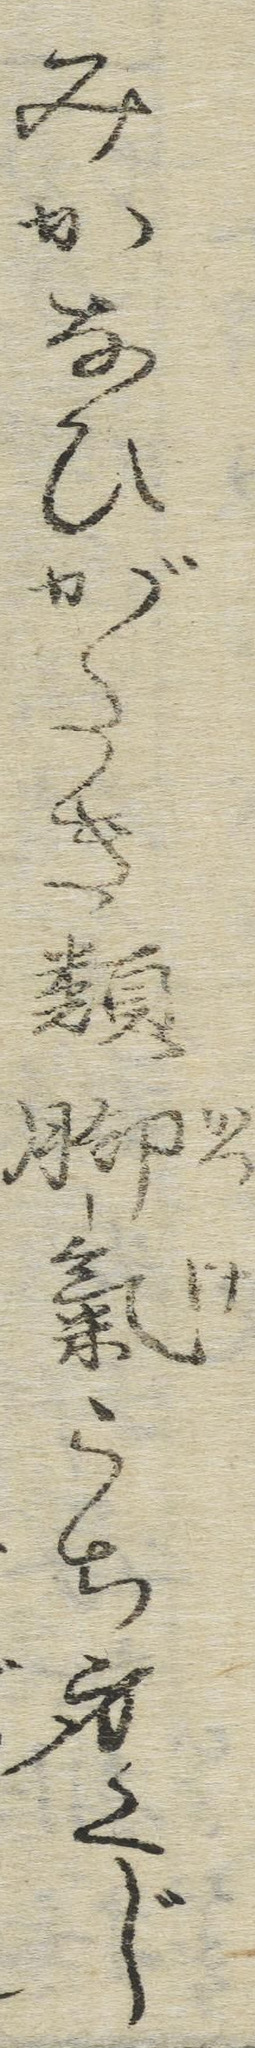みかなひがたき類脚気うち身くじ
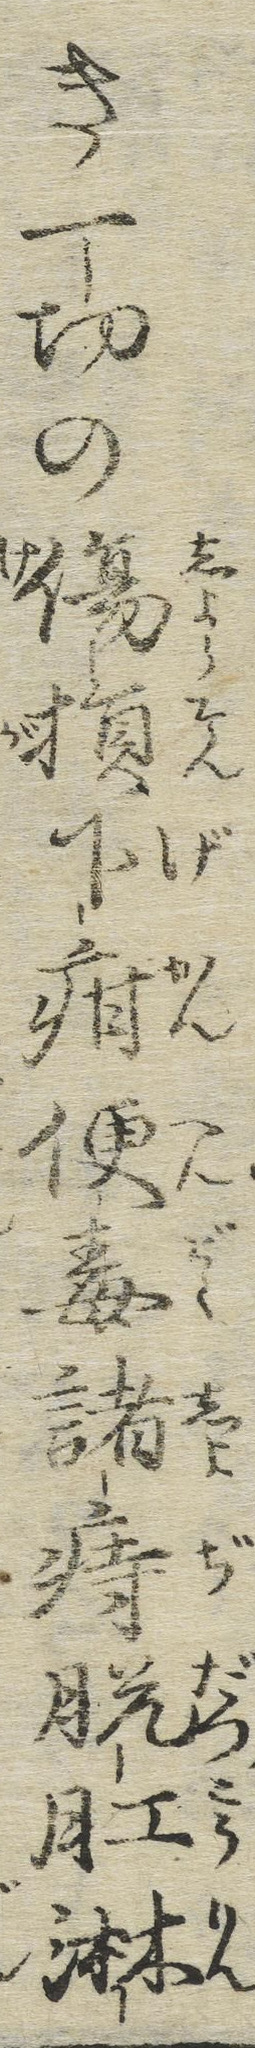き一切の傷損下疳便毒諸痔脱肛淋
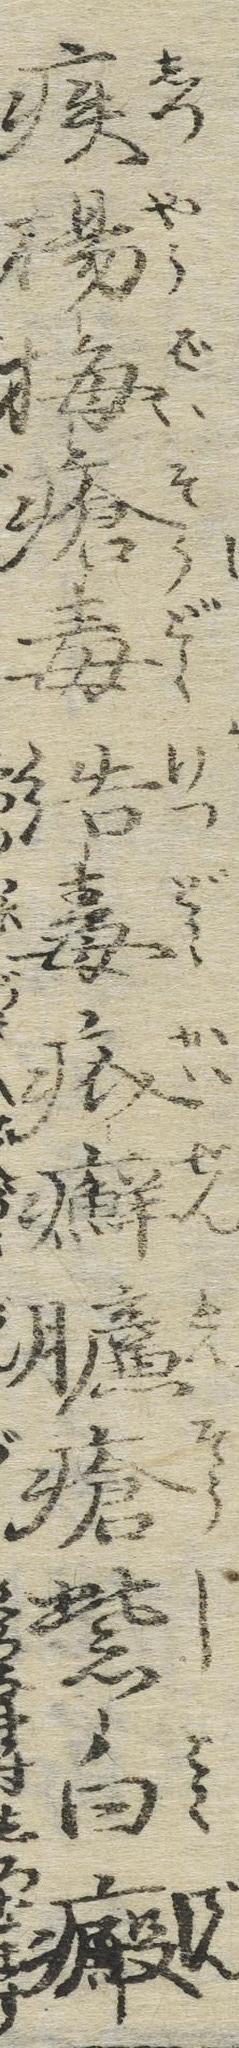疾揚梅瘡毒結毒疥癬臁瘡紫白癜
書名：温泉考
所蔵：東京大学地震研究所図書室 Earthquake Research Institute Library, The University of Tokyo, JAPAN
